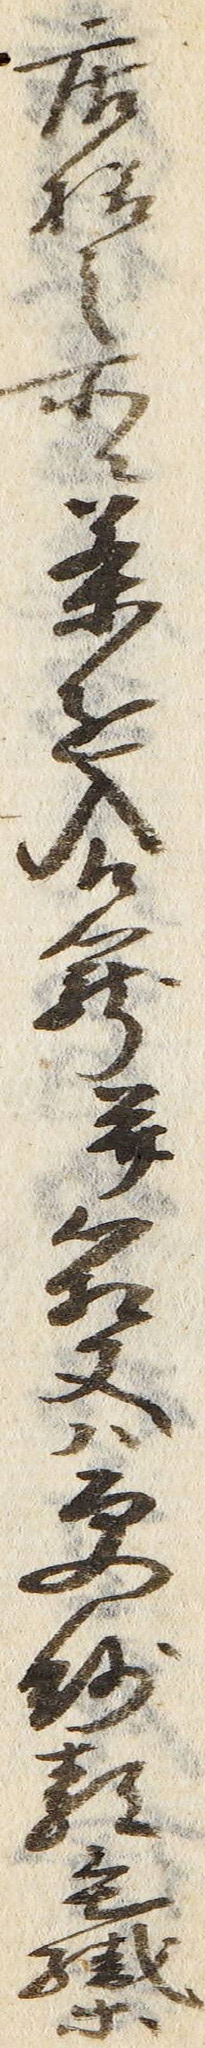店様之所ニ茶を入候籠幷箱又ハ更紗類毛織等
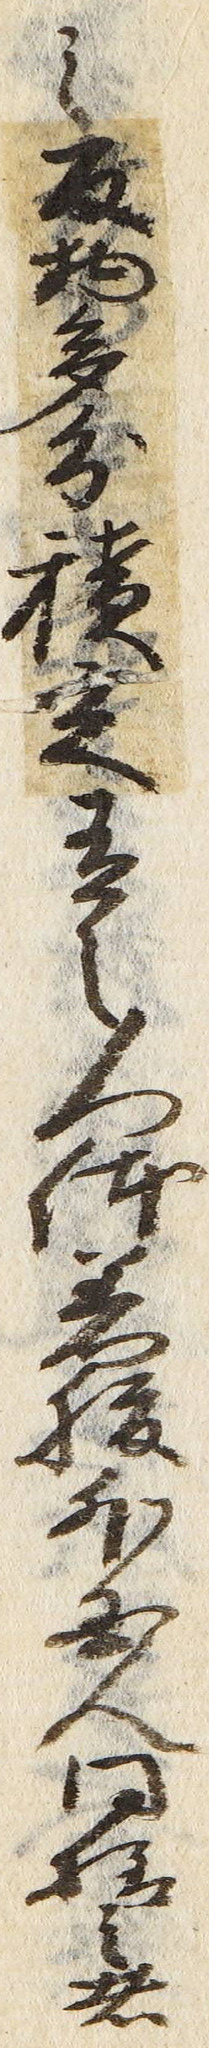之反物多分積定有之人体着服外国人同様之者
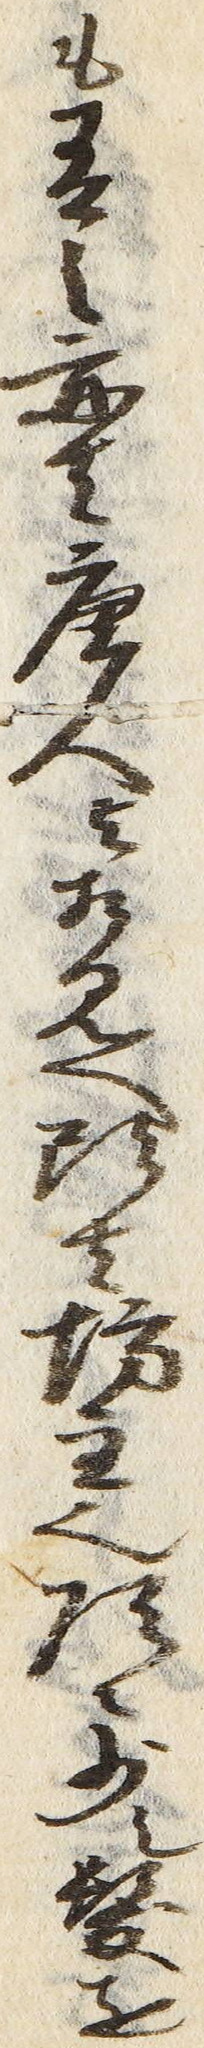も有之亦者唐人と相見へ頭者坊主也頭ニ少し髪を
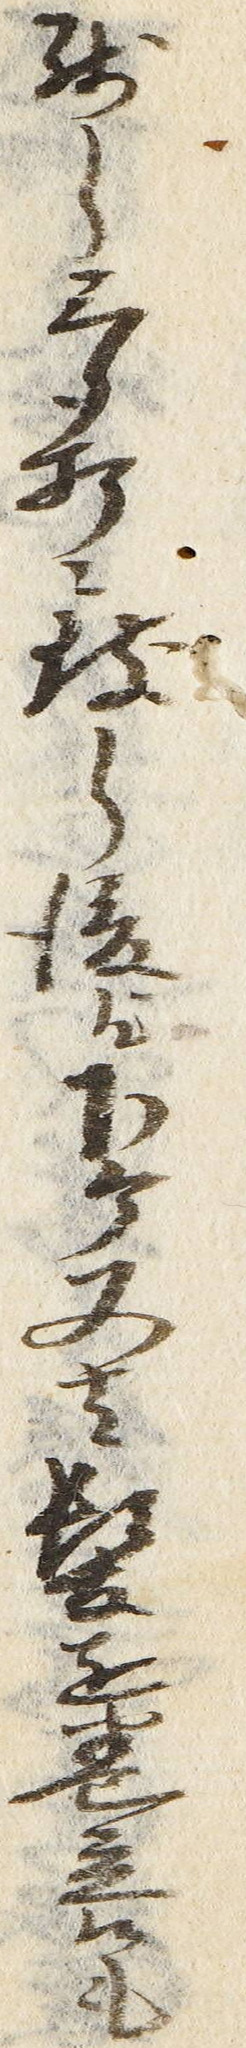残し三ツ折ニ致し後江下ケ又者髪を巻立候も
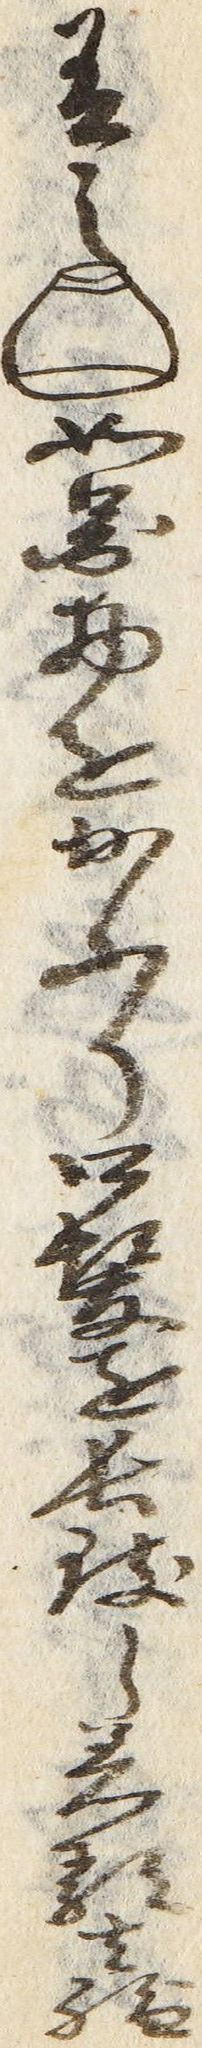有之如圖物をかふり口髪を長致し着類者絹
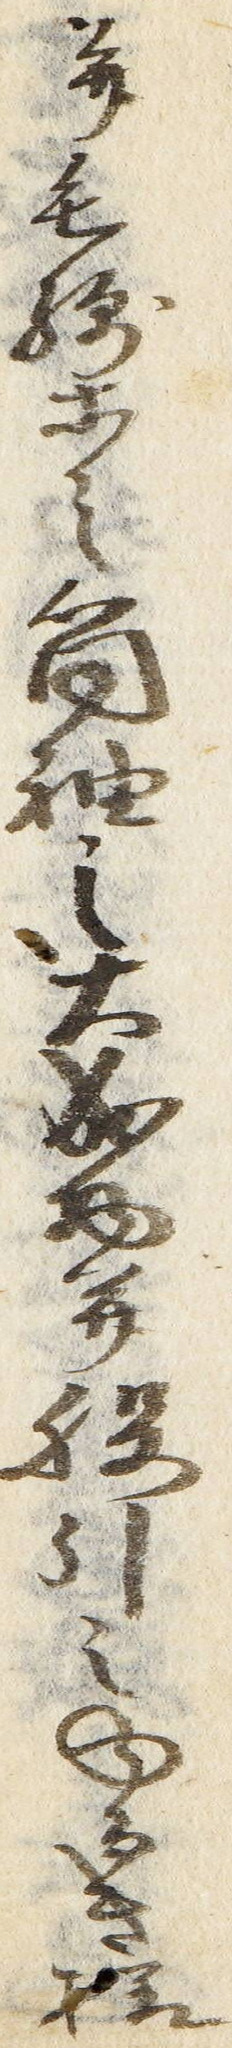幷毛綿等之筒袖之大成物幷股引之ゆるき様
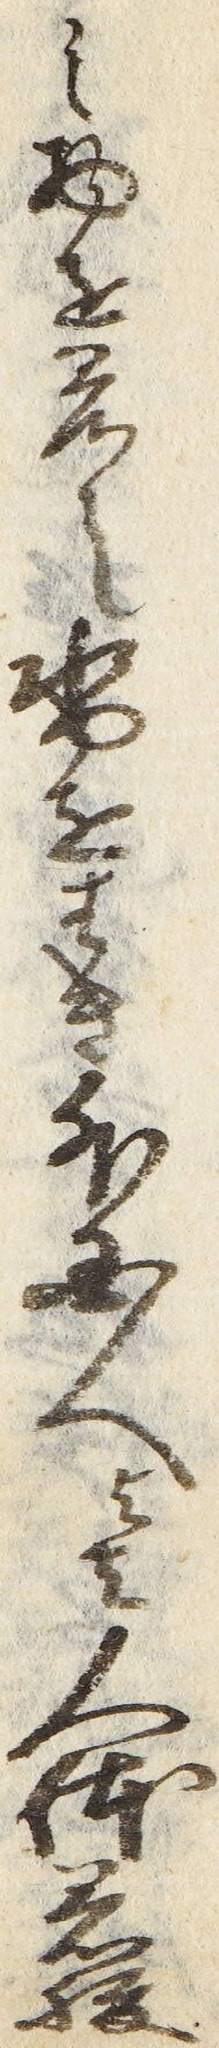之物を着し沓をはき外国人と者人体着服
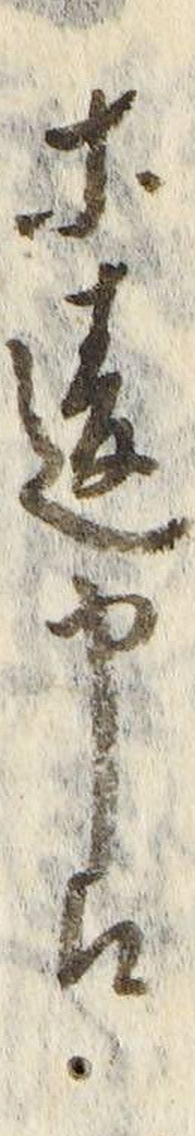等違申候

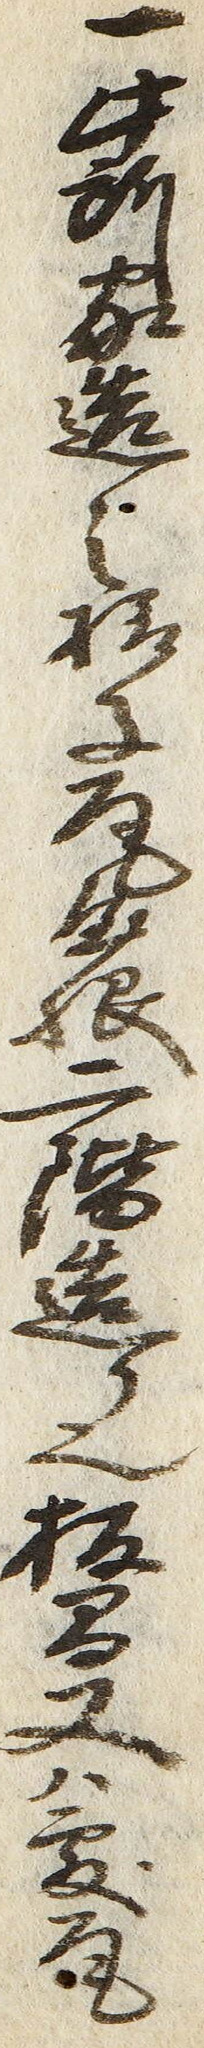一此所家造之様子瓦屋根二階造り也板間又ハ敷瓦
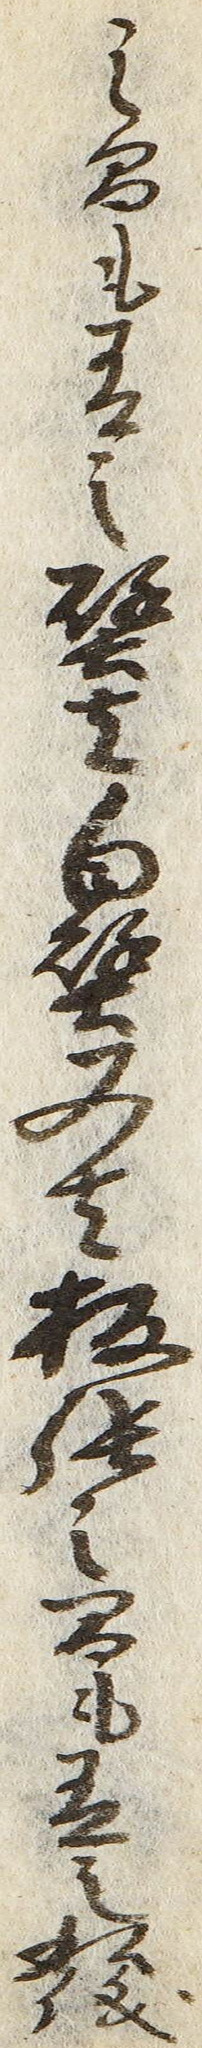之間も有之壁者白壁又者板張之間も有之私儀
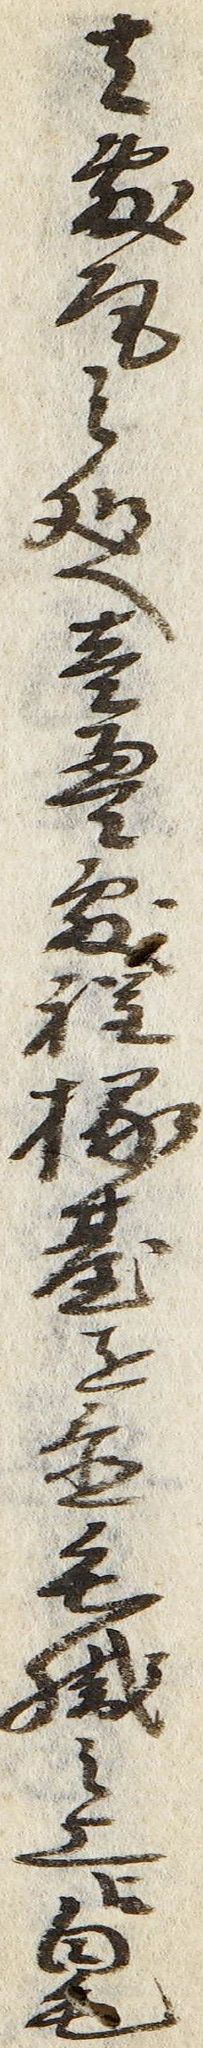者敷瓦之処へ壱畳敷程椽臺を置毛織之上江白毛
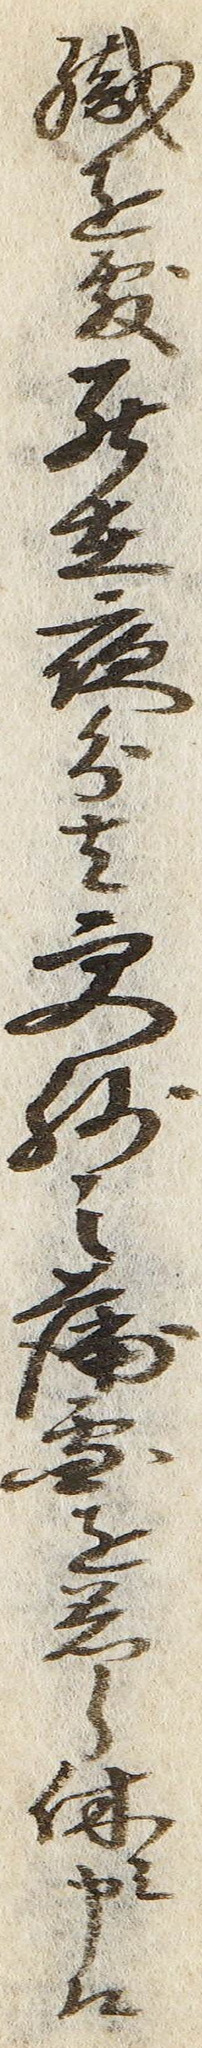織を敷罷在夜分者更紗之蒲團を着し休ミ申候
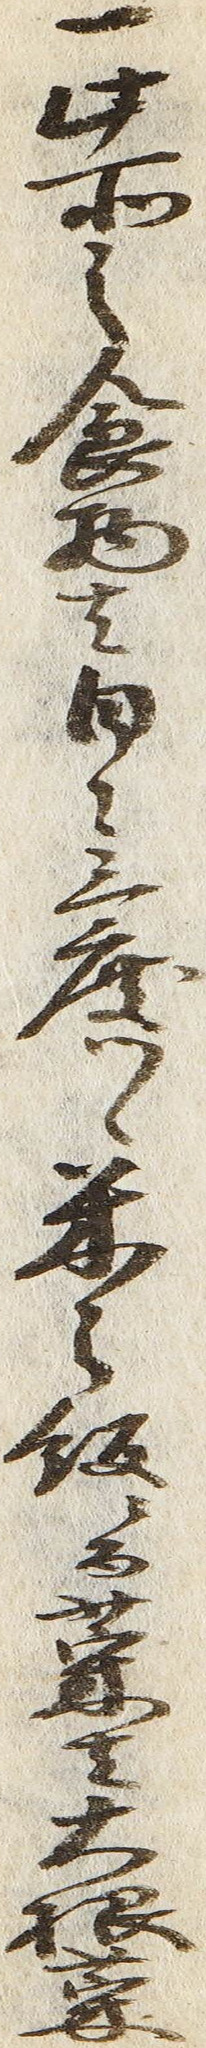一此所之食物者日々三度ツヽ米之飯ニ而菜者大根菜
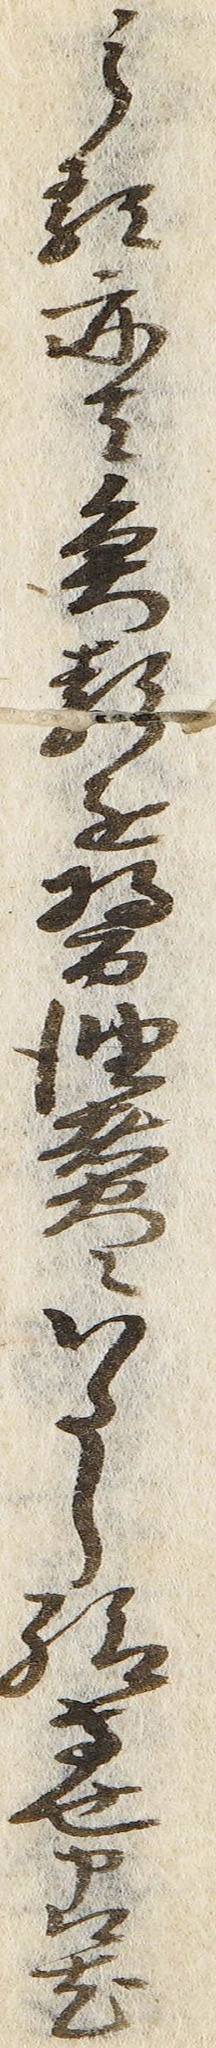之類亦者𩵋類を醤油煑ニいたし給させ申候尤
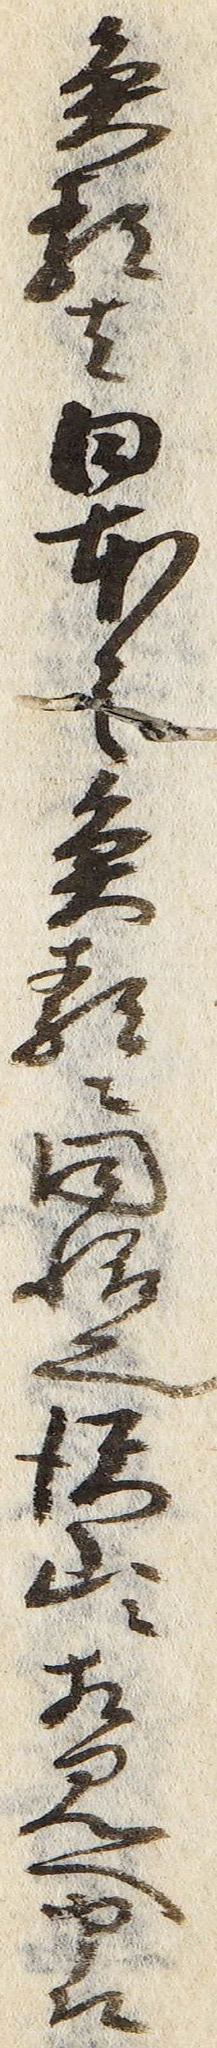𩵋類者日本之𩵋類ニ同様也沢山ニ相見へ申候
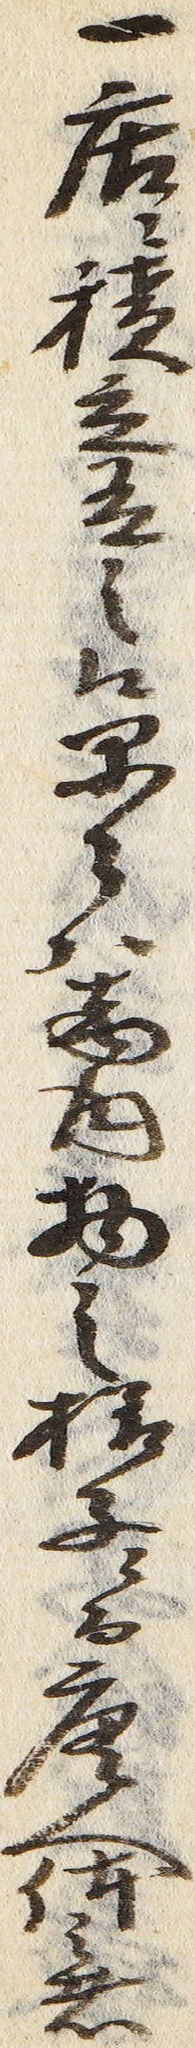一店ニ積立有之候品々ハ商内物之様子ニ而唐人体之者
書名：漂流人善助聞書
